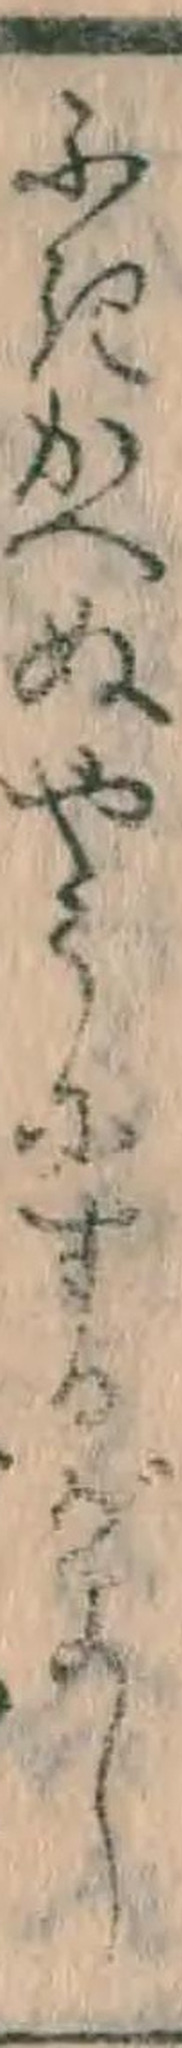ふきかへぬやうにするがよし
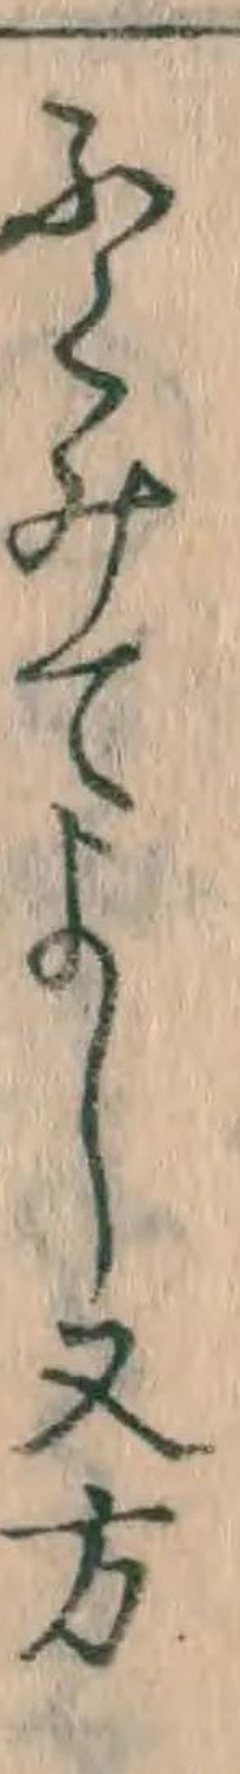ふくみてよし又方
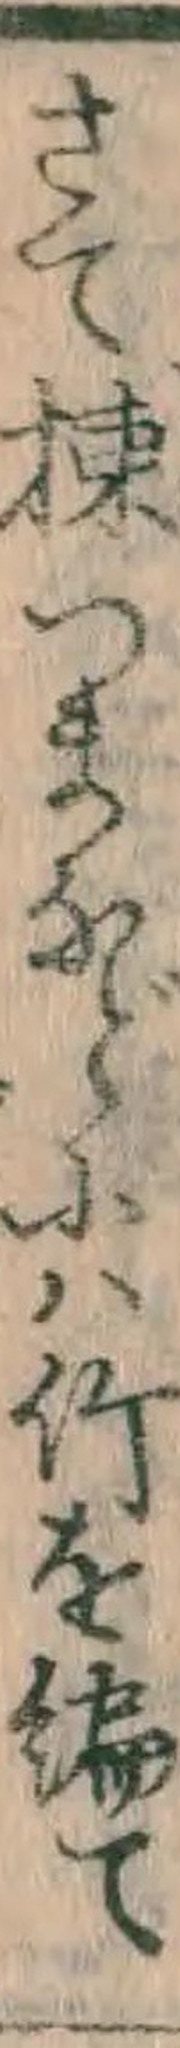さて棟つまなどには竹を編て
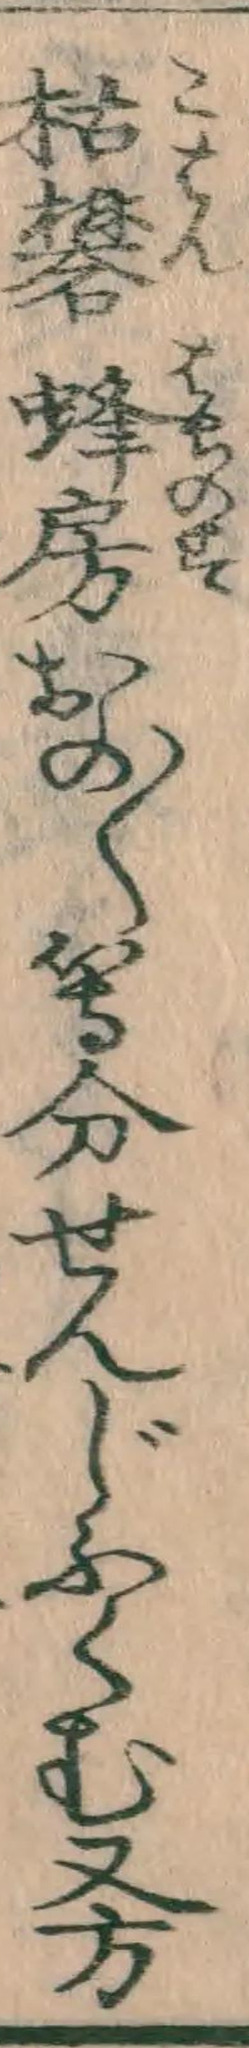枯礬蜂房おの〳〵等分せんじふくむ又方
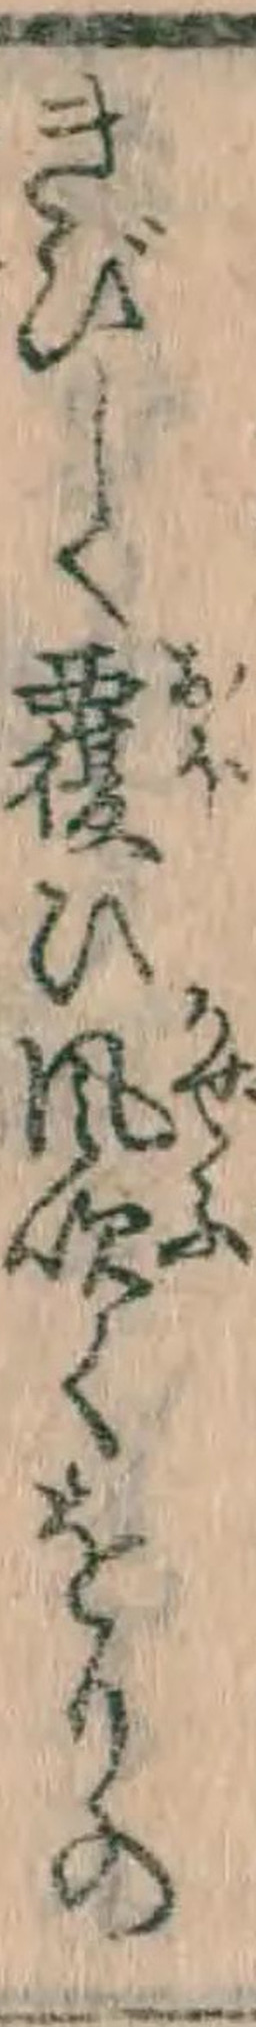きびしく覆ひ風吹くをりの
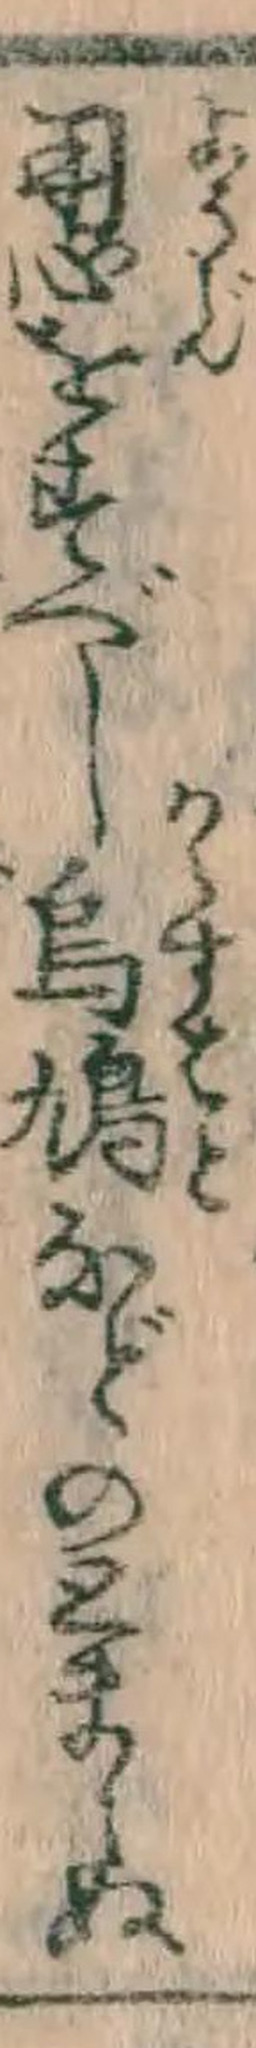用心をすべし烏鳩などのとまらぬ
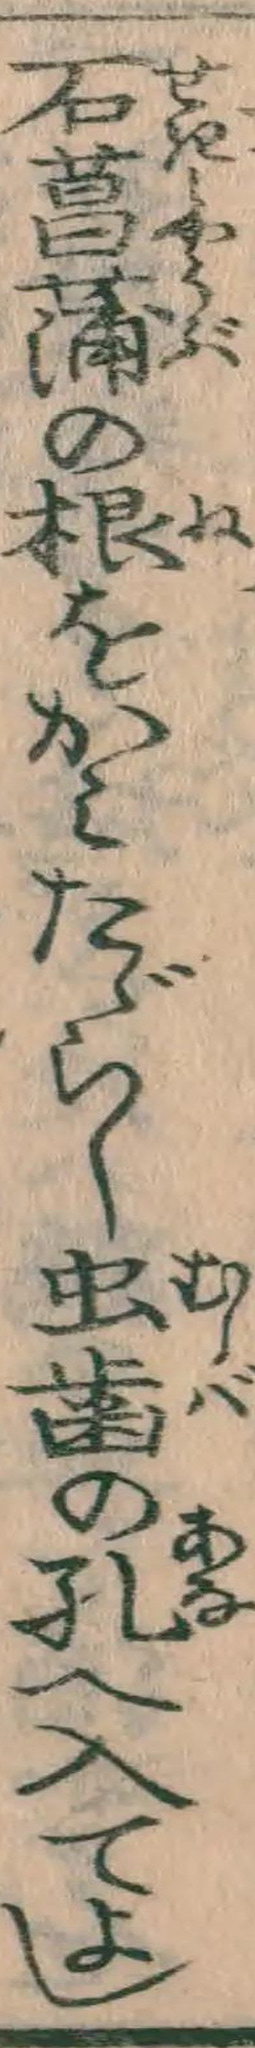石菖蒲の根をかみたゞらし虫歯の孔へ入てよし
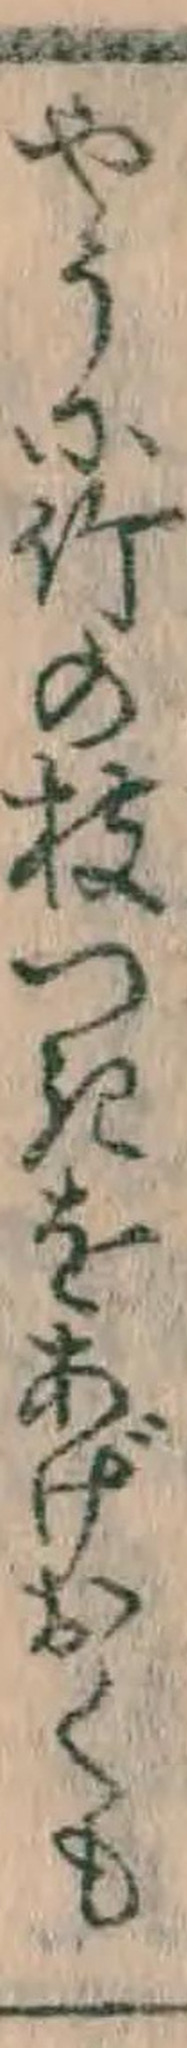やうに竹の枝つきをあげおくも
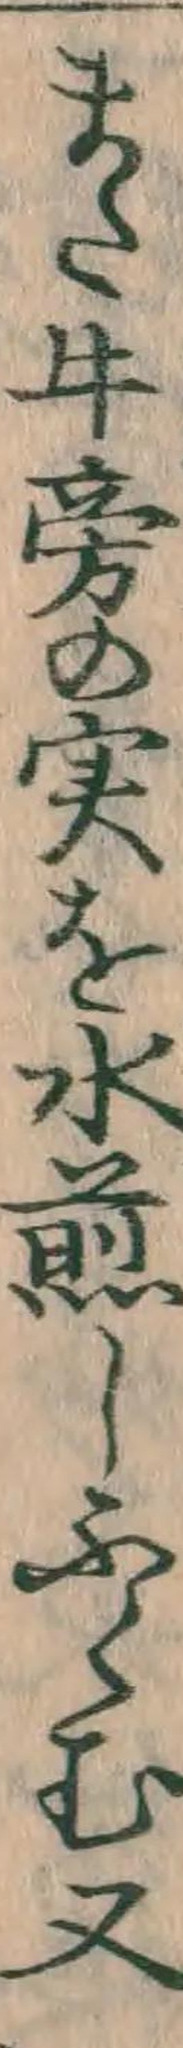また牛蒡の実を水煎しふくむ又
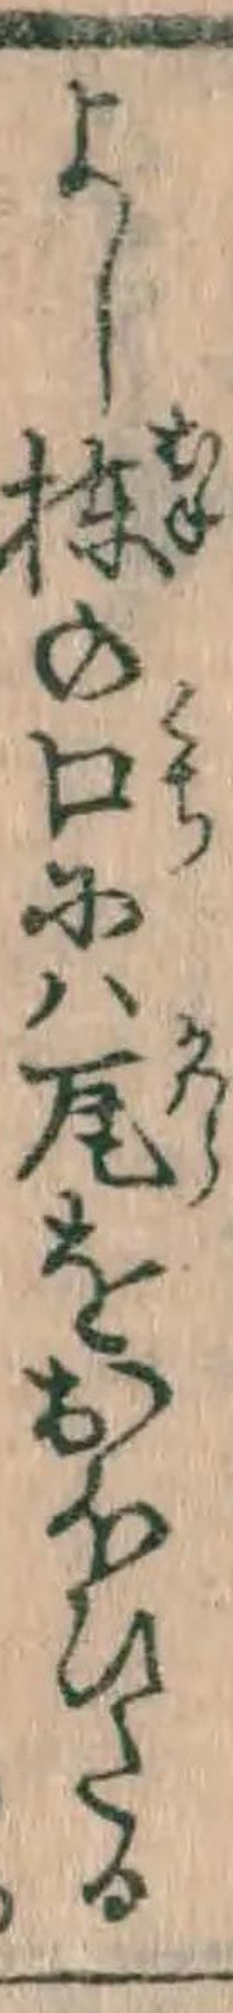よし棟の口には瓦をおほひたる
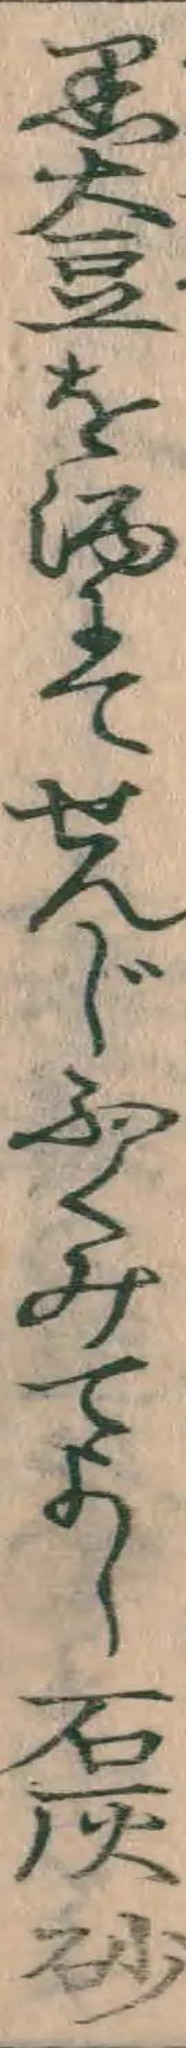黒豆を酒にてせんじふくみてよし石灰砂
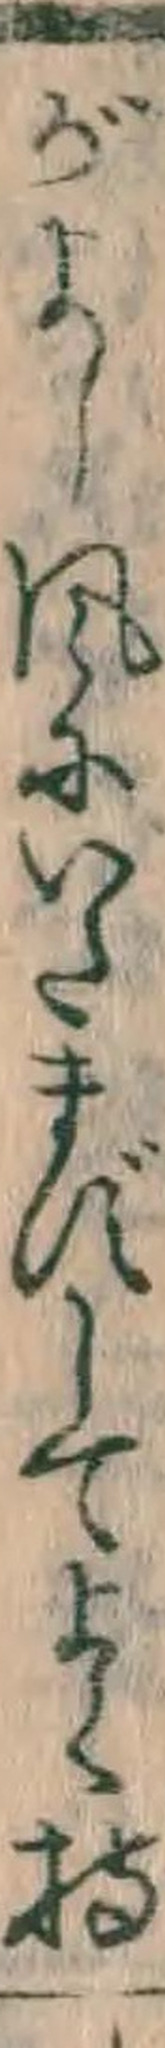がよし風にいたまずしてよく持
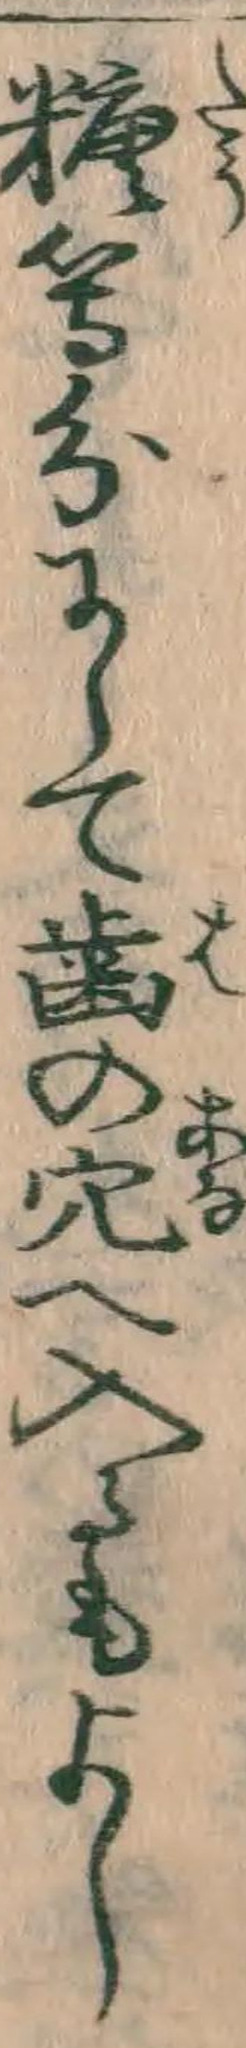糖等分にして歯の穴へ入るもよし
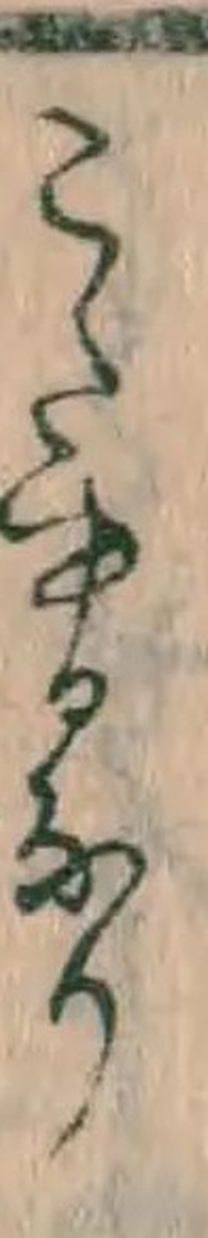こたゆるなり
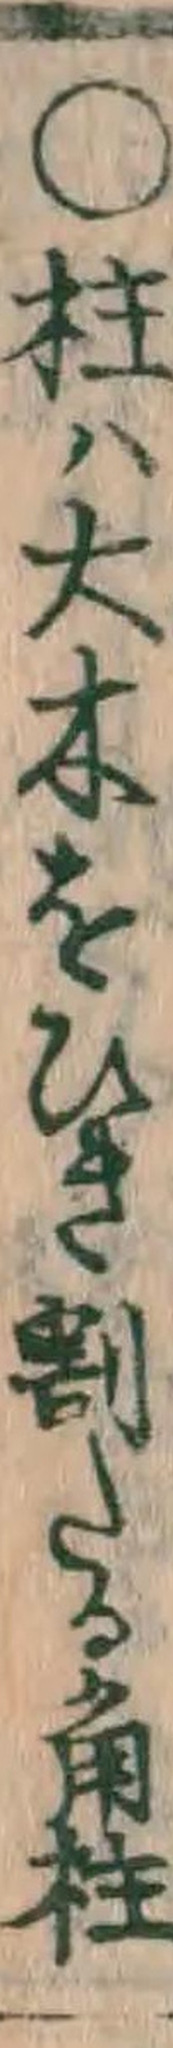○柱は大木をひき割たる角柱
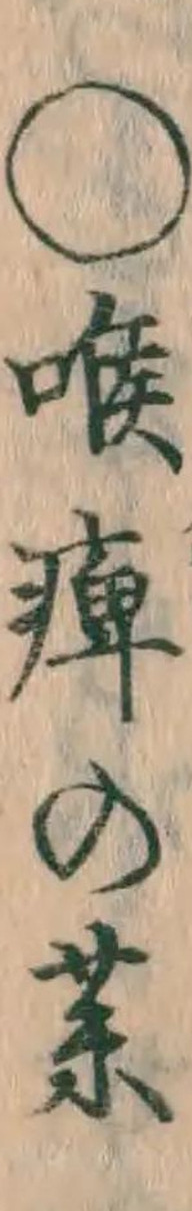○喉痺の薬
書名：広益秘事大全 3巻. [3]
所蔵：国立国会図書館 National Diet Library, JAPAN
